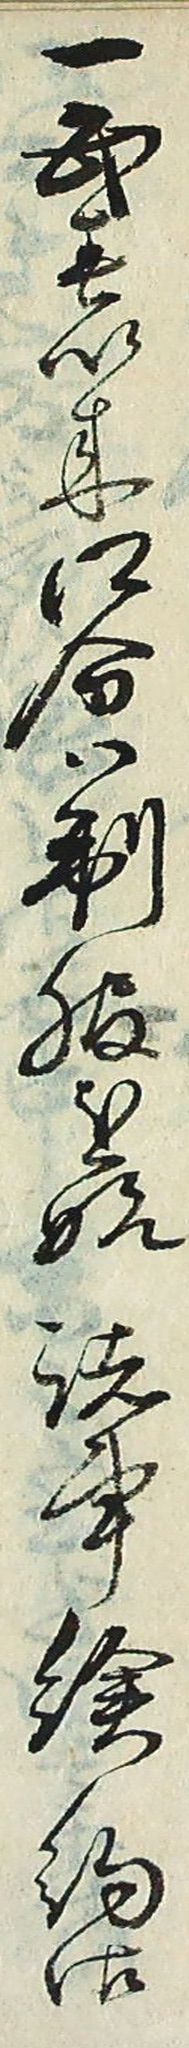一当春以来郷分は制服を始諸事倹約御
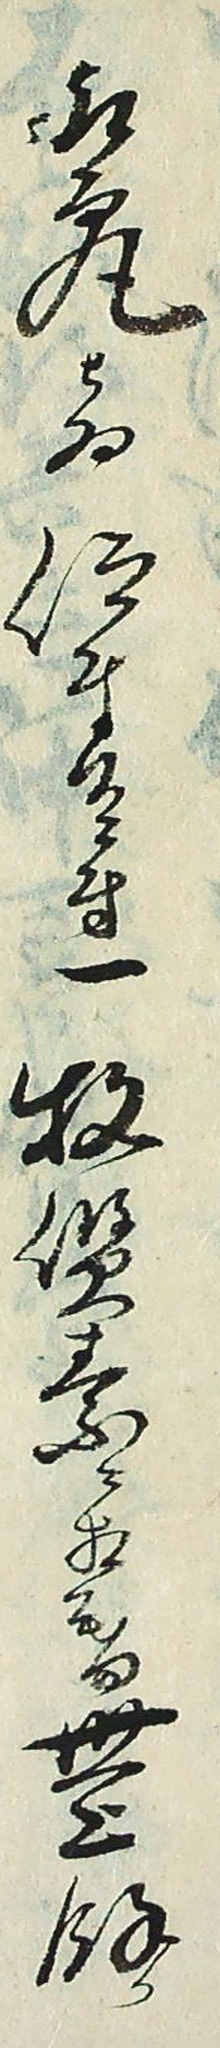取究被為仰付候に付一牧質素に相暮世上余り
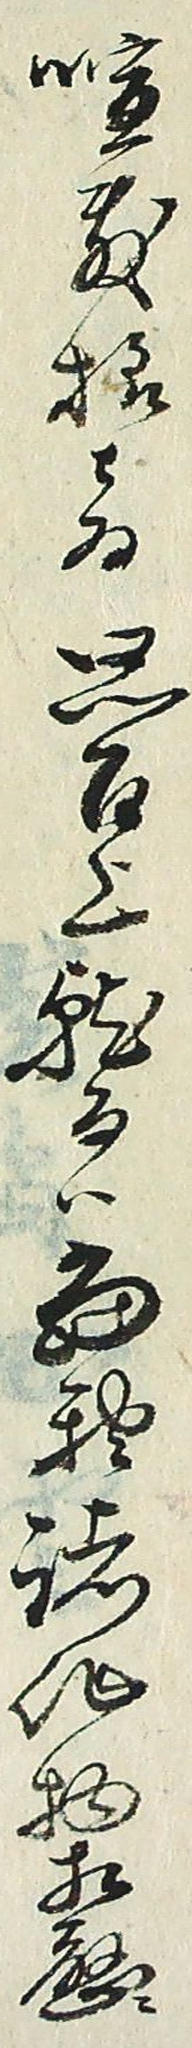喧敷様被為思召上就而は当秋諸作物相応に
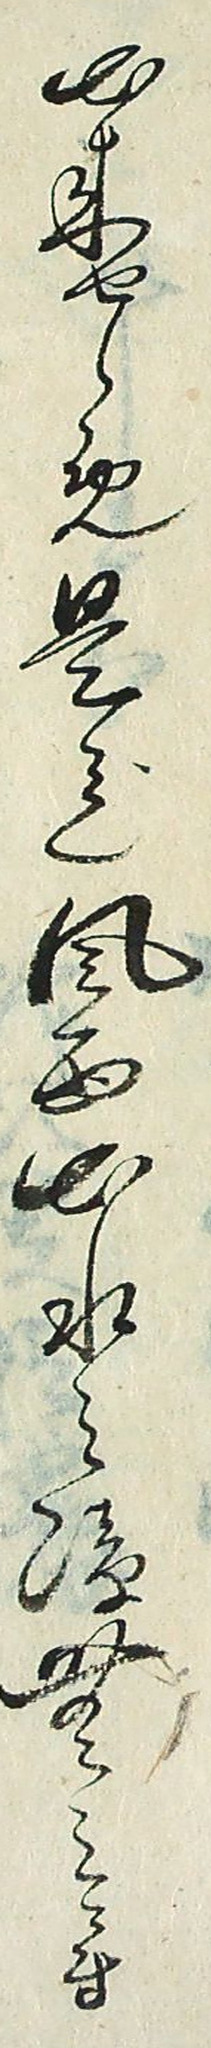出来せしめ是迄風雨出水之障無之に付
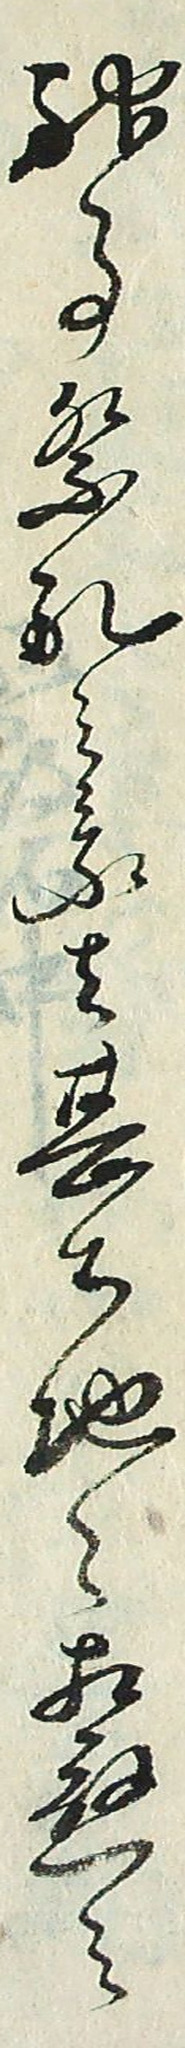神事祭礼之義者其土地〳〵相応之
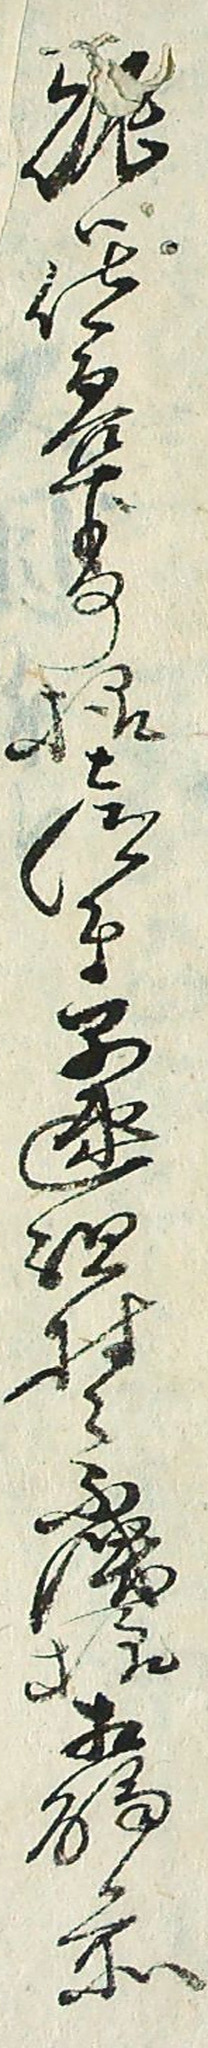賑は仕候而宜布様被仰付早速組村々不洩様相触候所

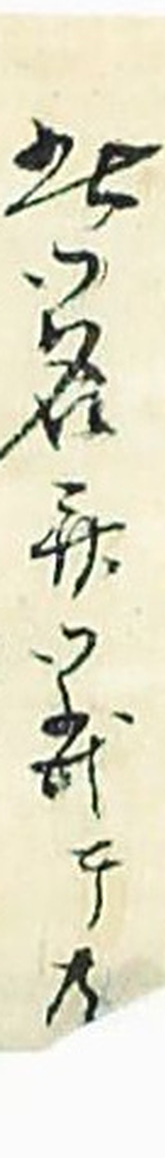此御名幷御当て共
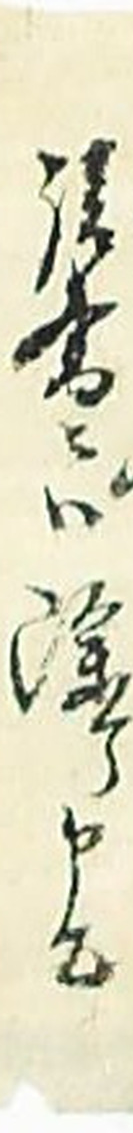請書には除け申候

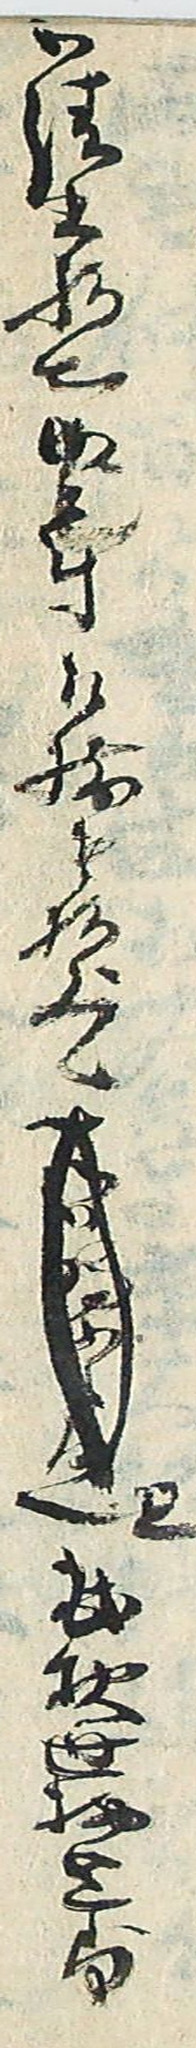御請書指出候に付取揃奉指上候且当秋世柄宜布
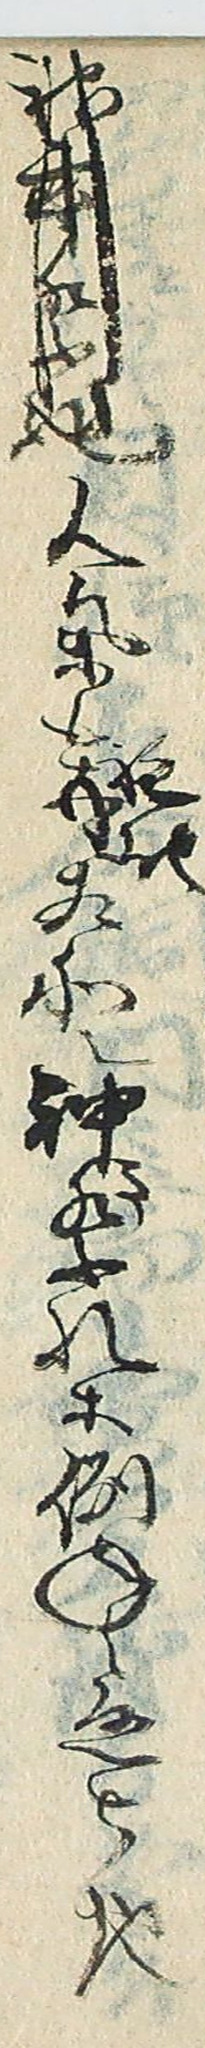神事祭礼人気も程能相和し神事祭礼等例年之通土地
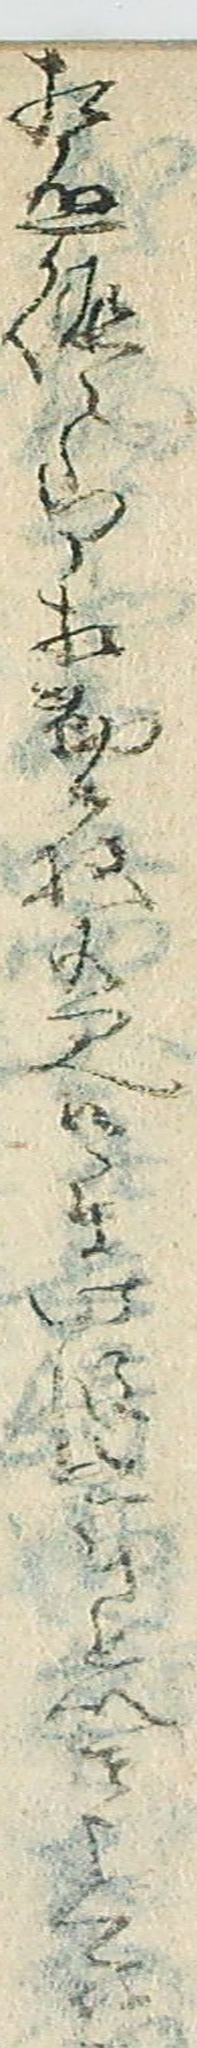相応賑々布相勤候様相見候に付此段書付を以奉申上候
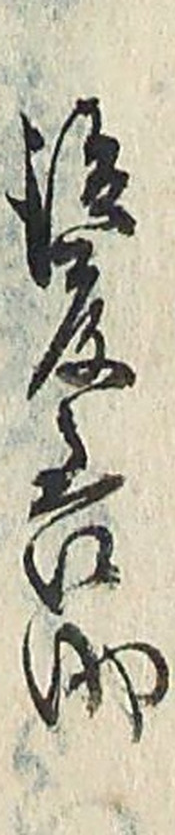後藤善助
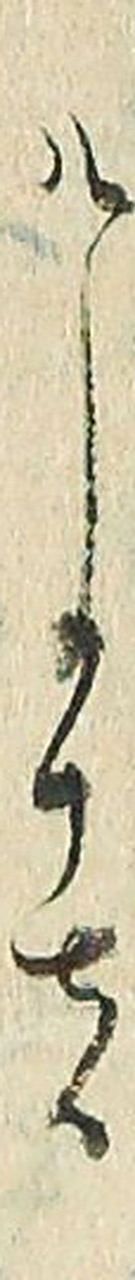八月十七日
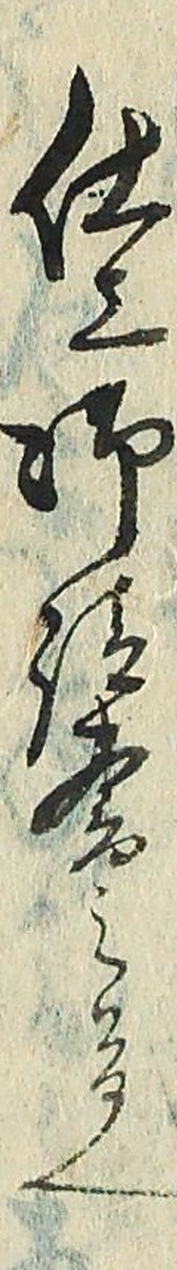仕上御請書之覚
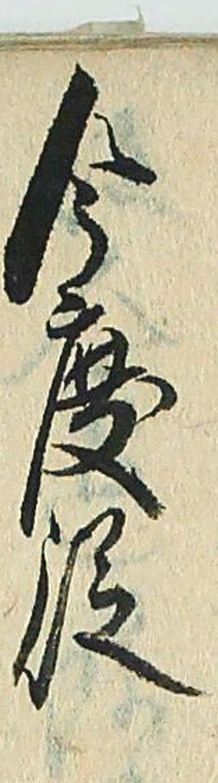今度従
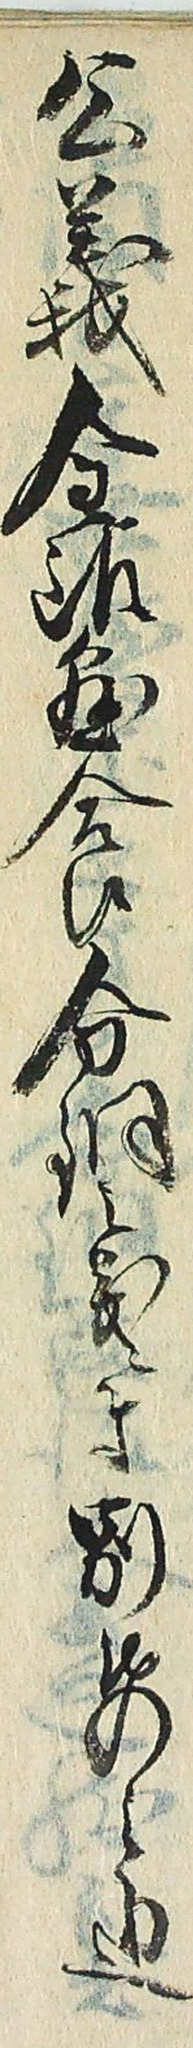公儀金銀懸合候分銅之義に付別帋之通
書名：諸御用御□受書控
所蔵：鳴門教育大学 Naruto University of Education
